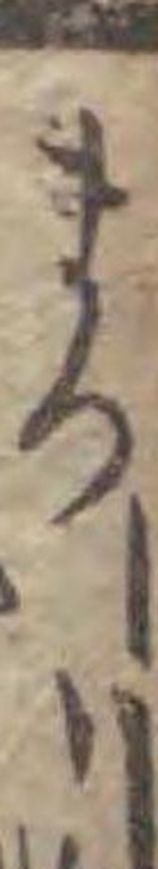まつ風
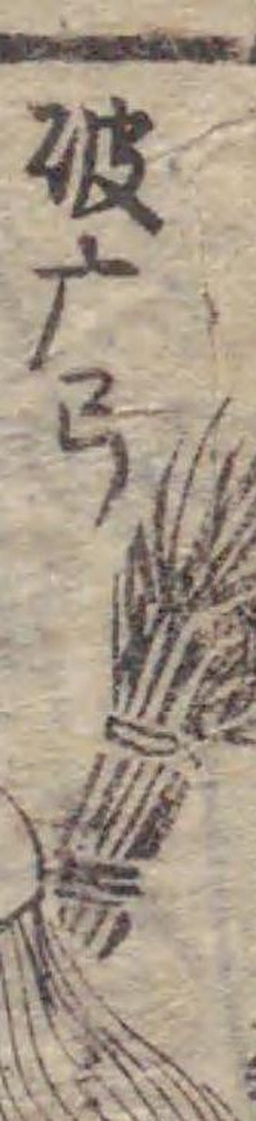破魔弓
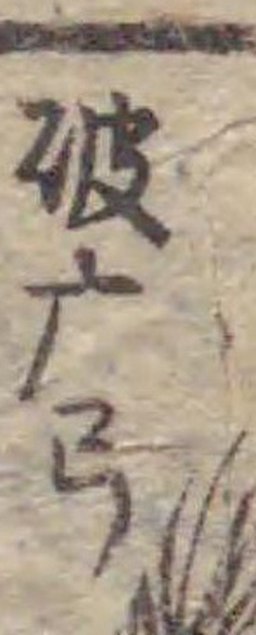破魔弓
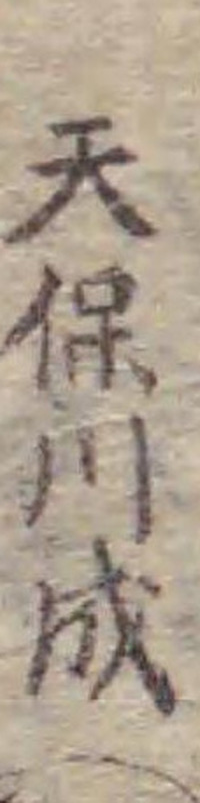天保川成
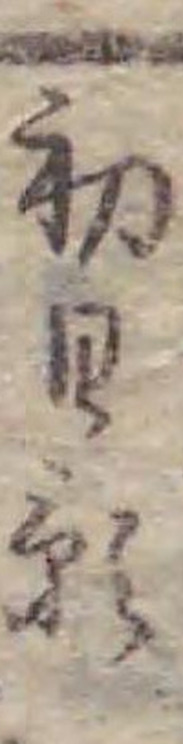初日影
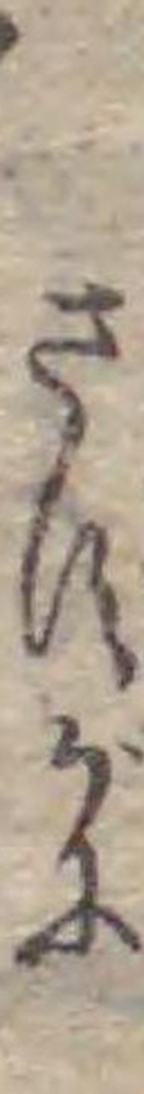さすがに
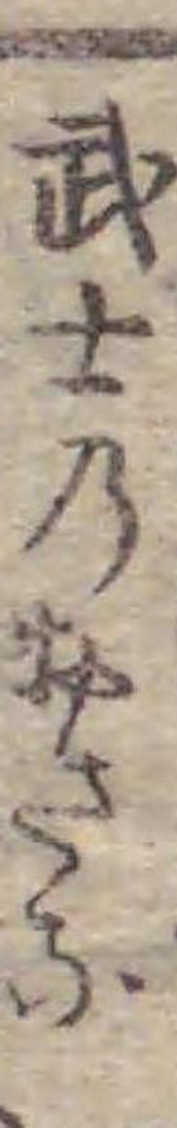武士のおさな
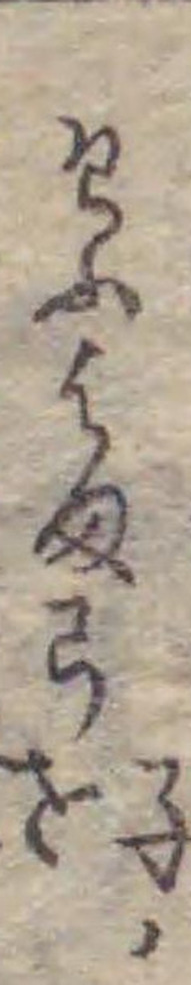けふはま弓を
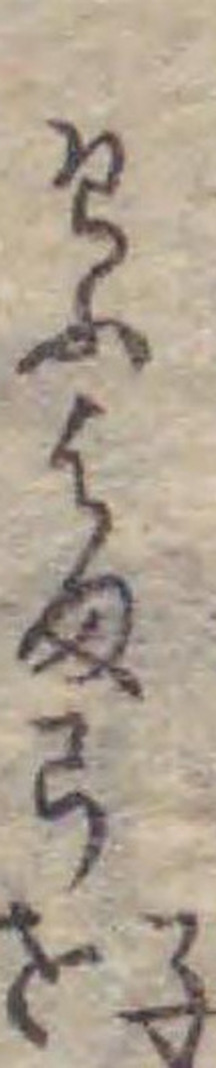けふはま弓を
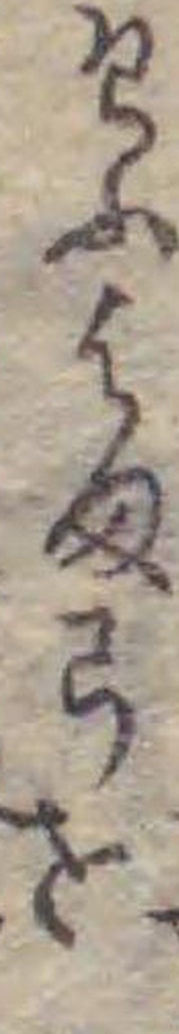けふはま弓を
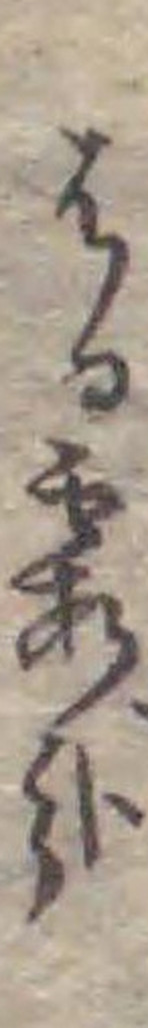はる霞哉
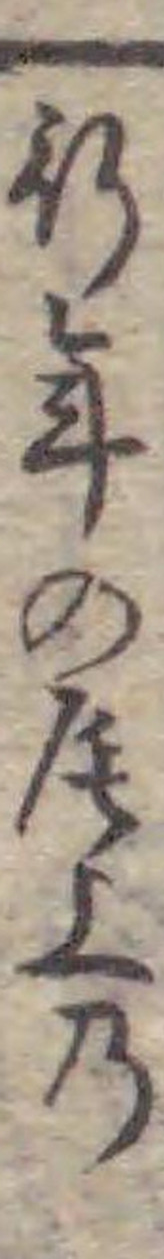行年の尾上の
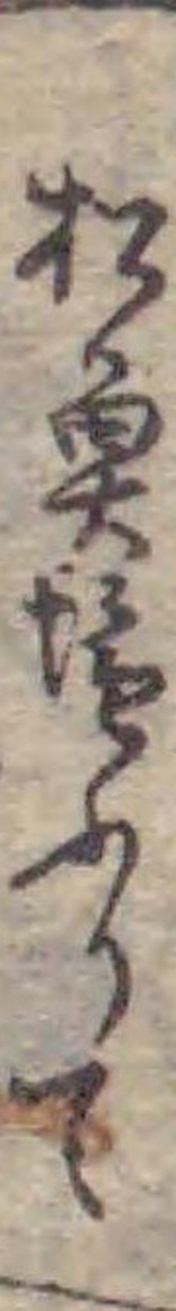松魚塩ふりて

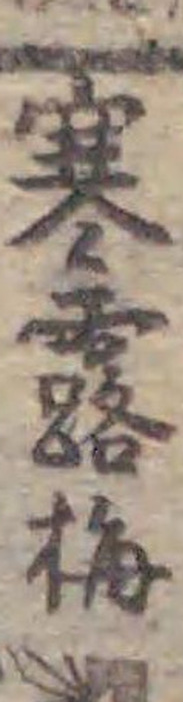寒露梅
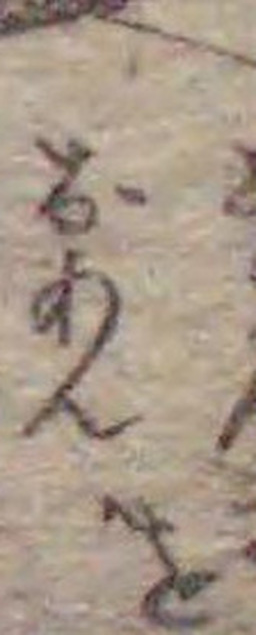おあん
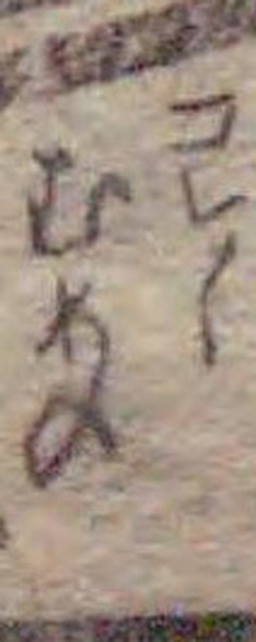むめの
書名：年始御礼帳 : 3巻
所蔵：国立国会図書館 National Diet Library, JAPAN
